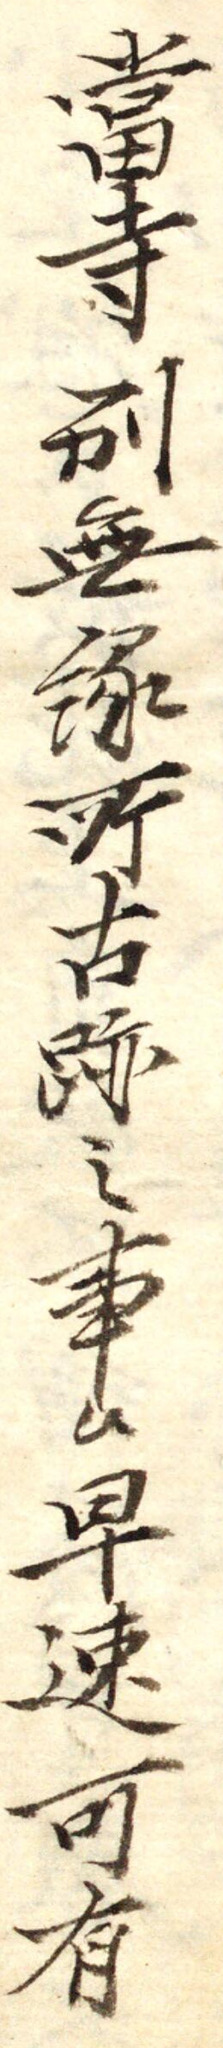当寺別無縁所古関古跡之事候早速可有

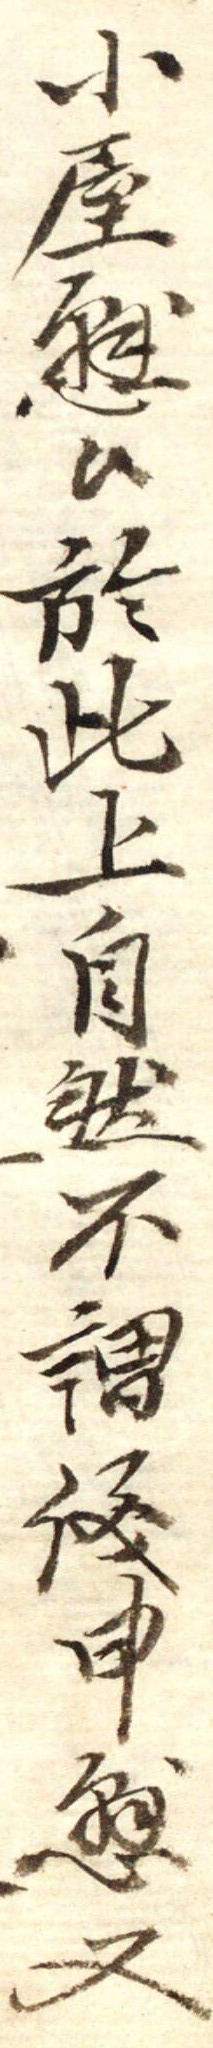小屋懸候於此上自然不謂儀申懸又
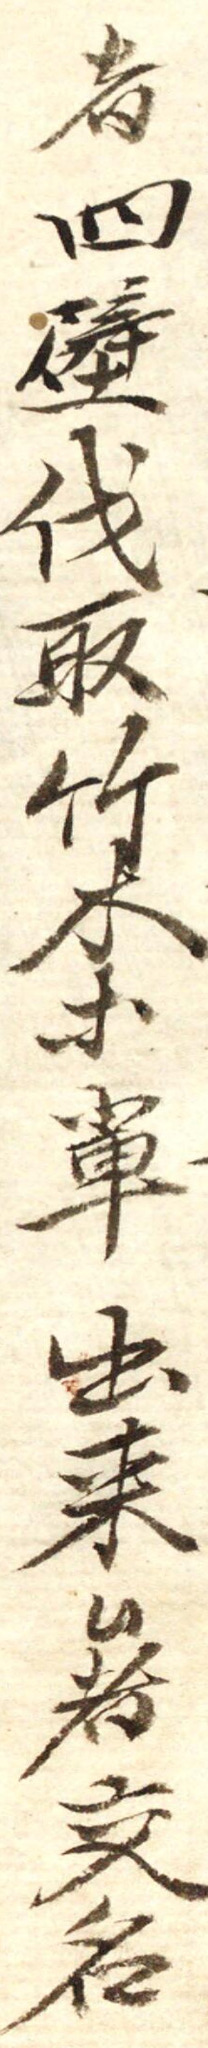者四壁伐取竹木等輩出来候者交名
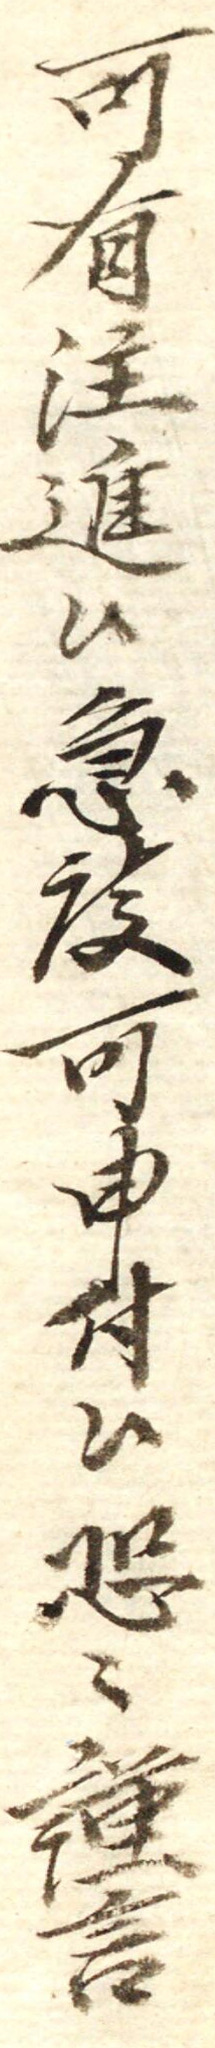可有注進候急度可申付候恐々謹言
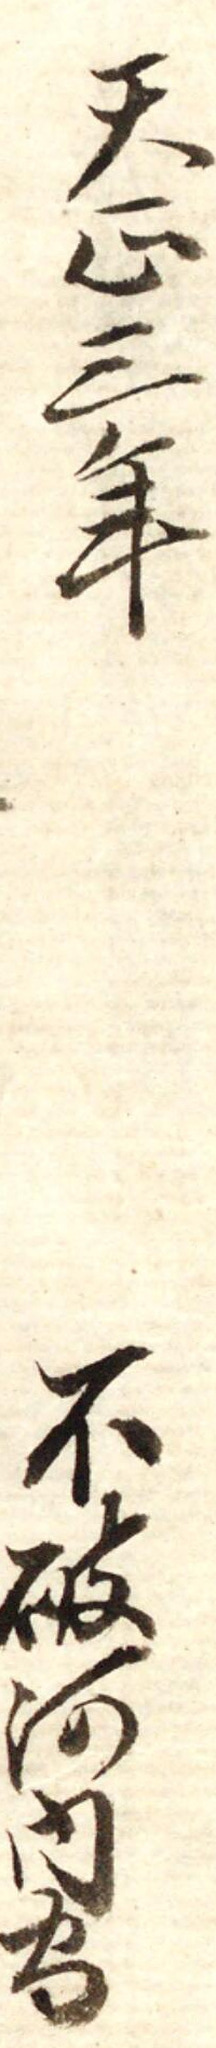天正三年不破河内守
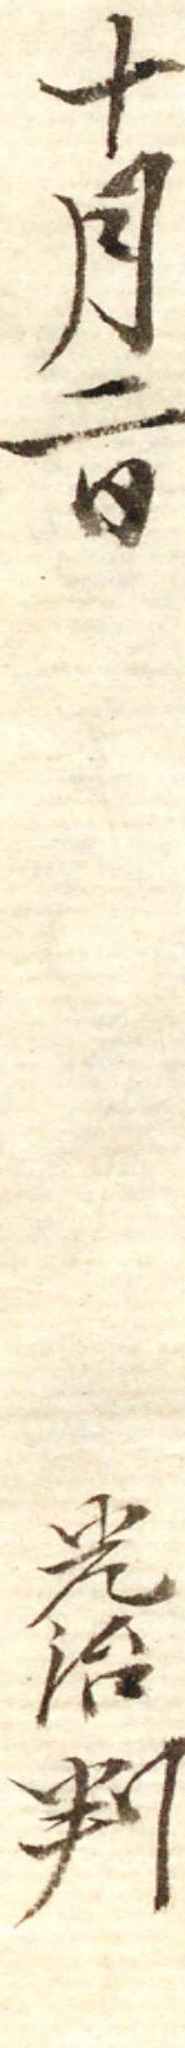十月二日光治判
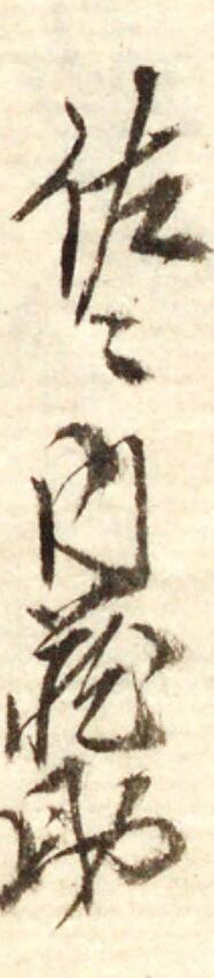佐々内蔵助
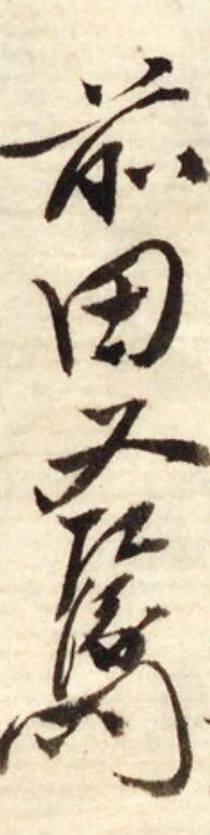前田又左衛門
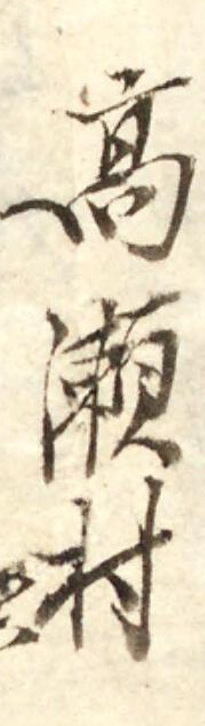高瀬村
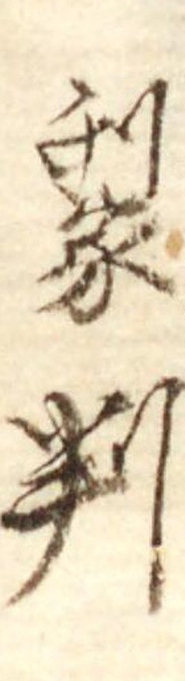利家判
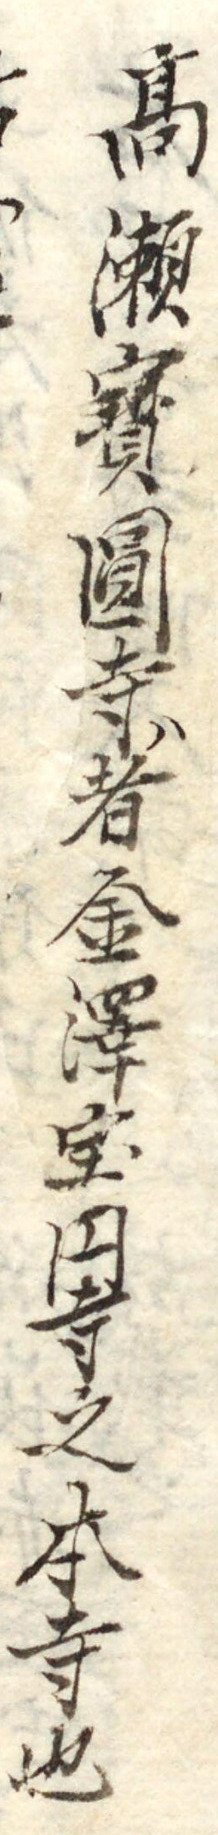高瀬宝圓寺者金澤宝円寺之本寺也
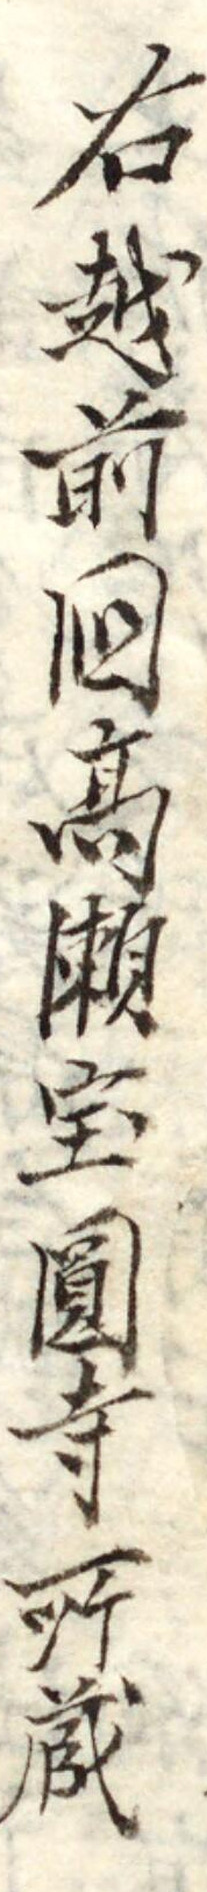右越前国高瀬宝圓寺所蔵
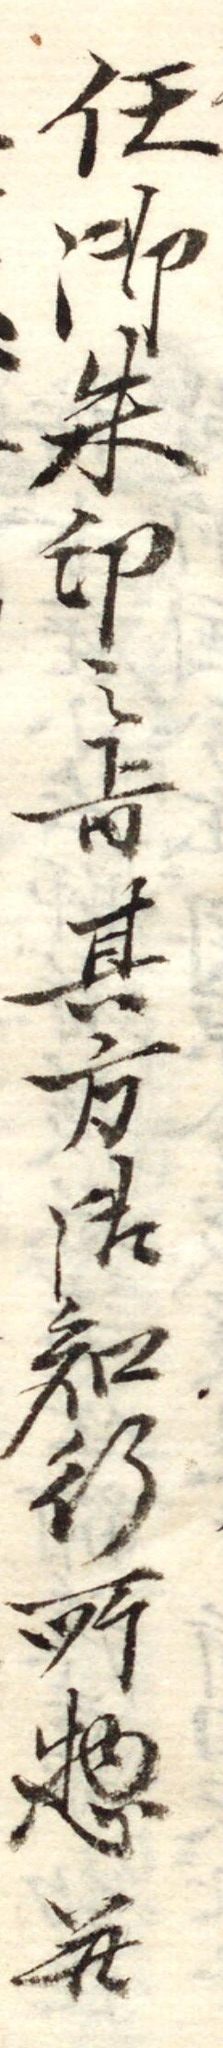任御朱印之宗其方御知行所惣幷
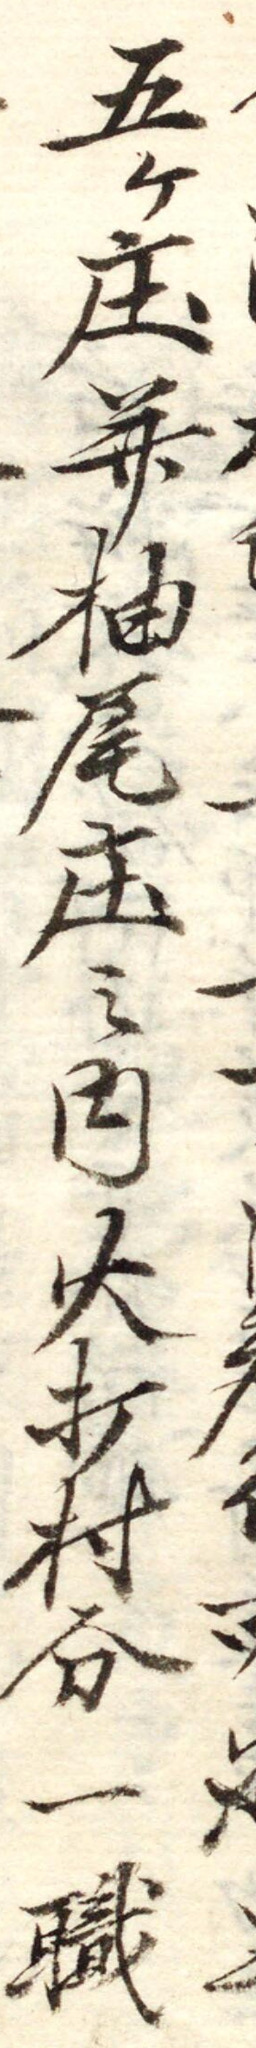五ケ庄幷柚尾庄之内火打村分一職
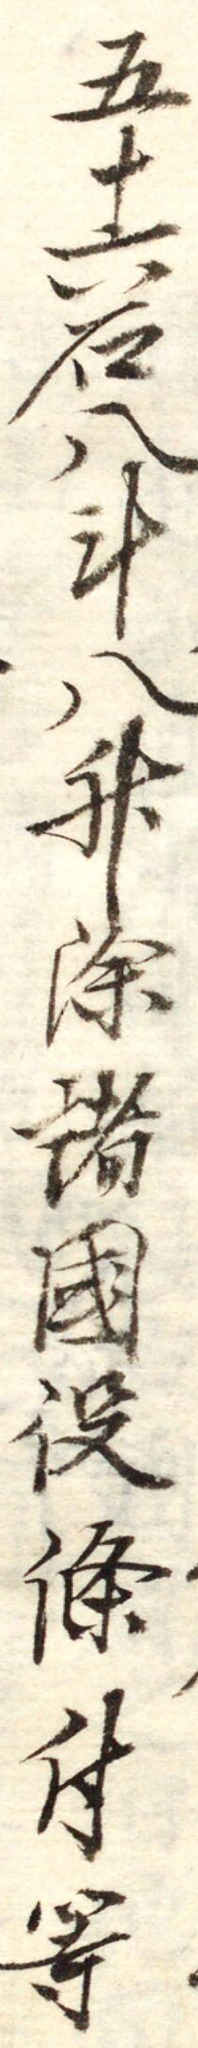五十六石八斗八升除諸国役條付等
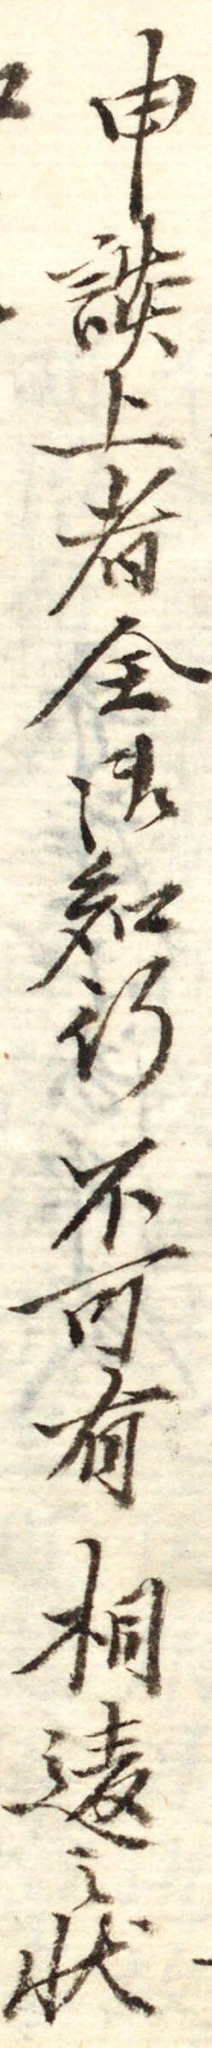申談上者全御知行不可有相違之状
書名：前田家封国証書集録
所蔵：Ishikawa Prefectural Library
